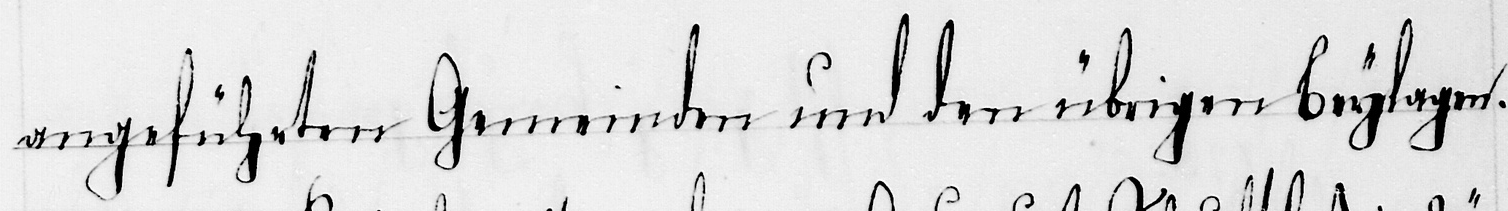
angeführten Gemeinden und den übrigen Beylagen.
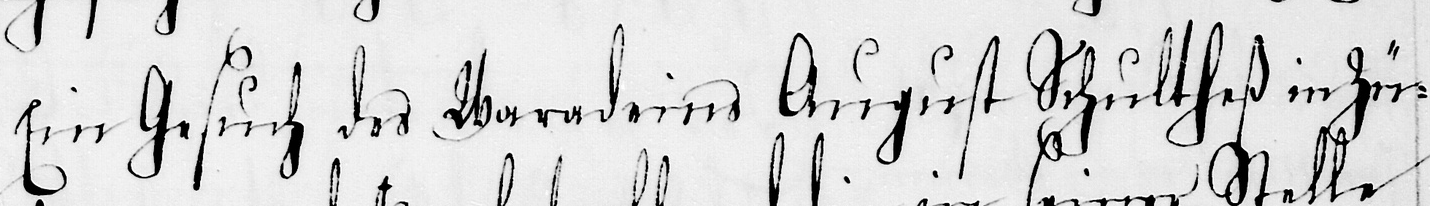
Ein Gesuch des Waradeins August Schultheß in Zü¬
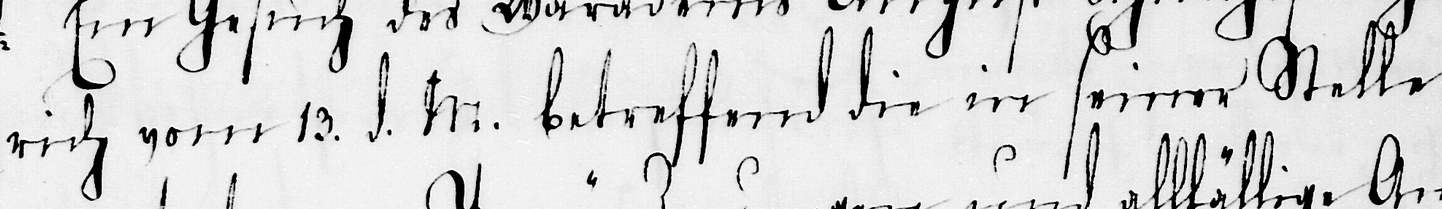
rich vom 13. d. M. betreffend die in seiner Stelle
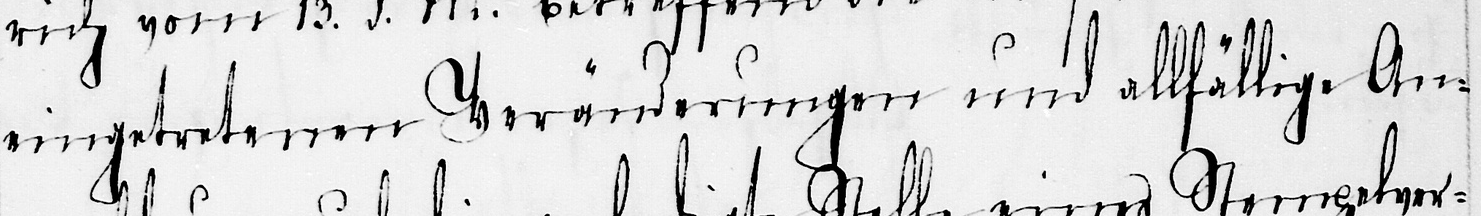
eingetretenen Veränderungen und allfällige An¬
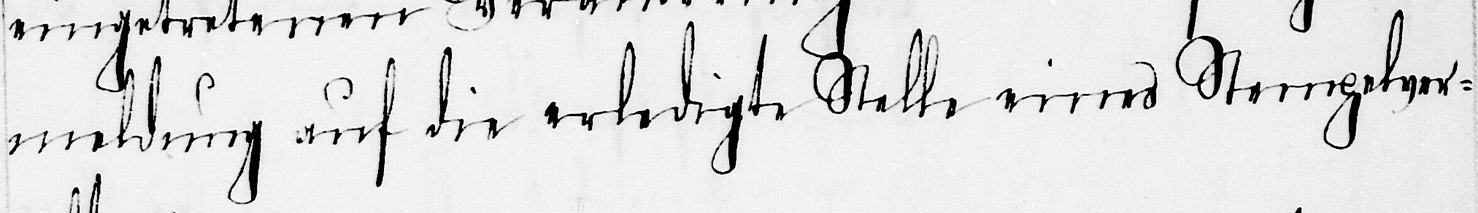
meldung auf die erledigte Stelle eines Stempelver¬
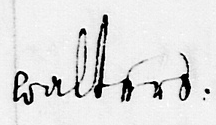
walters.
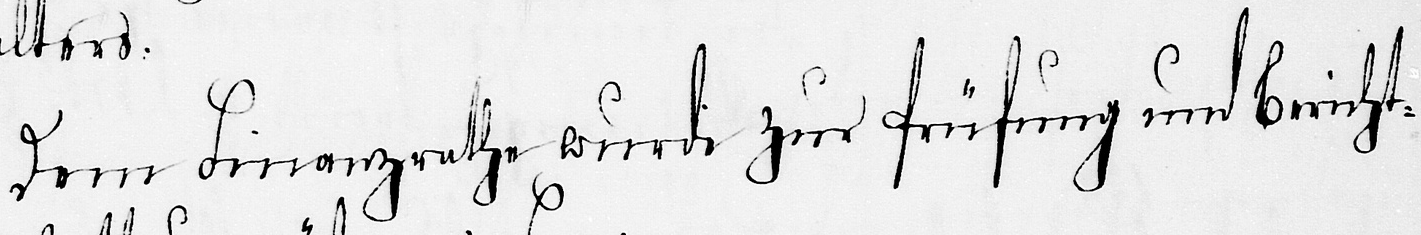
Dem Finanzrathe wurde zur Prüfung und Bericht¬
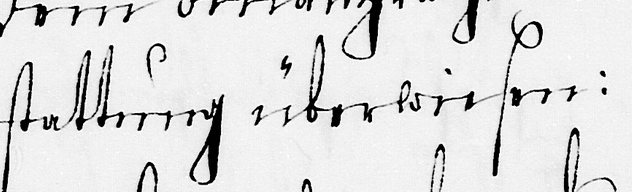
stattung überwiesen:
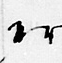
er¬
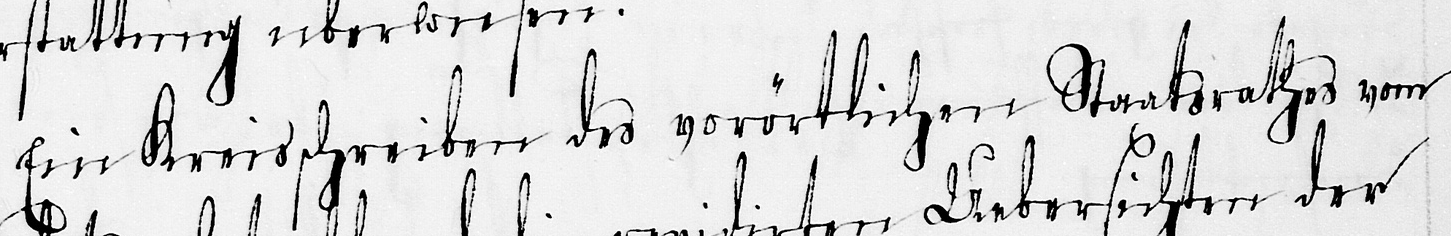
Ein Kreisschreiben des vorörtlichen Staatsrathes vom
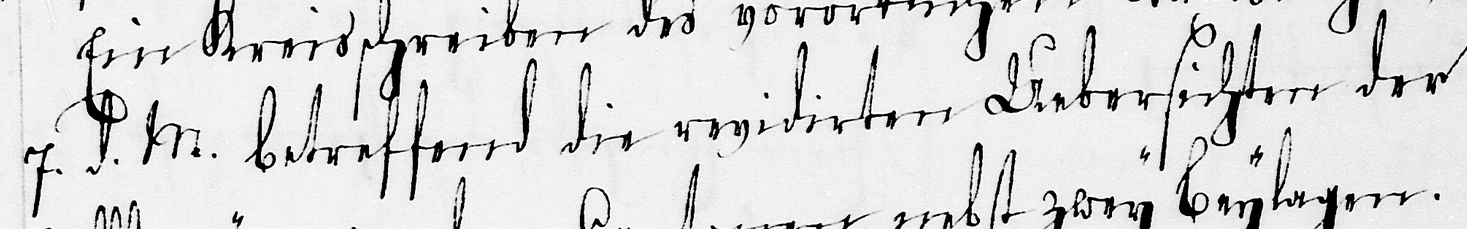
7. d. M. betreffend die revidirten Uebersichten der
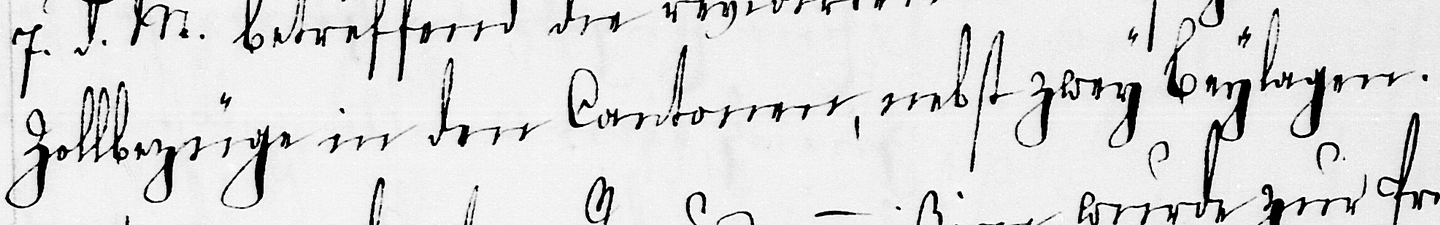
Zollbezüge in den Cantonen, nebst zwey Beylagen.
